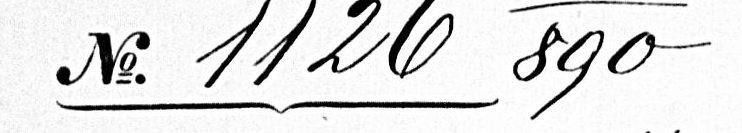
N° 1126 890
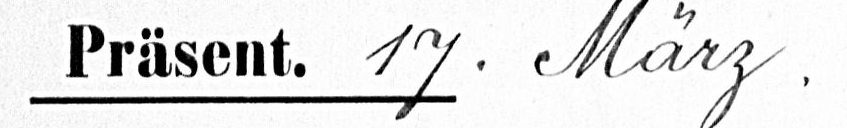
Präsent. 17. März.
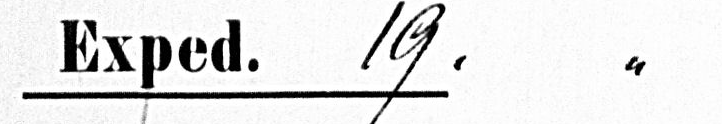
Exped. 19. März.
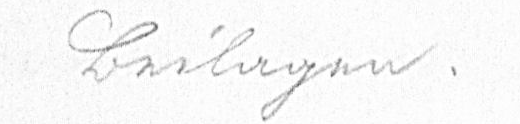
Beilagen.
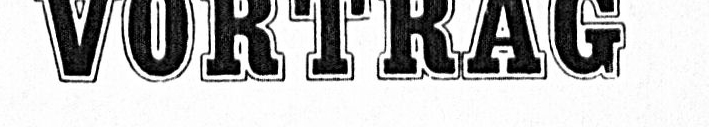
VORTRAG
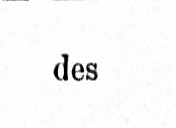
des
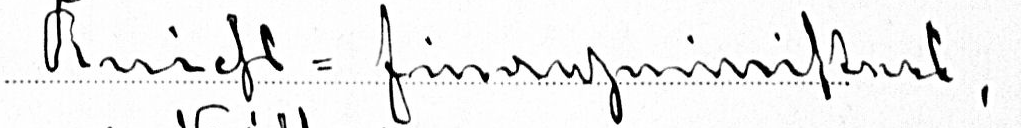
Reichs = Finanzministers,
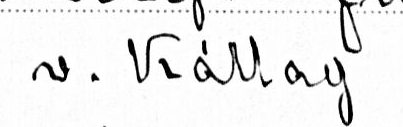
v. Kállag
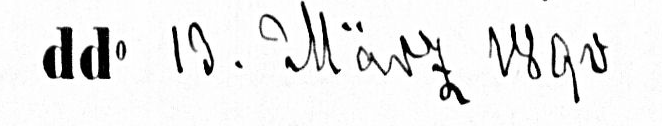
dd° 13. März 1890
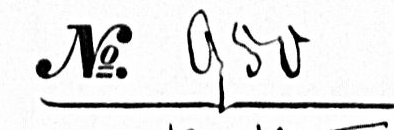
N° 950
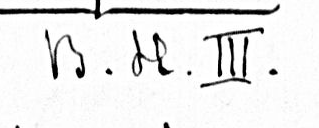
B. H. III.
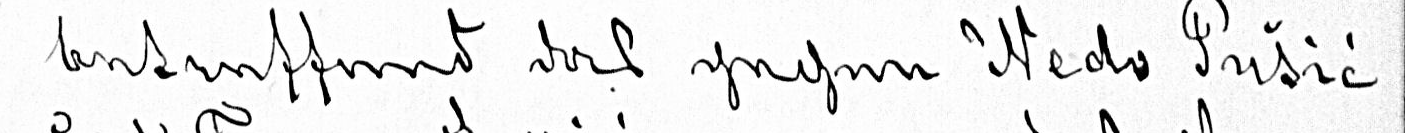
Betreffend das gegen Nedo Pusić
